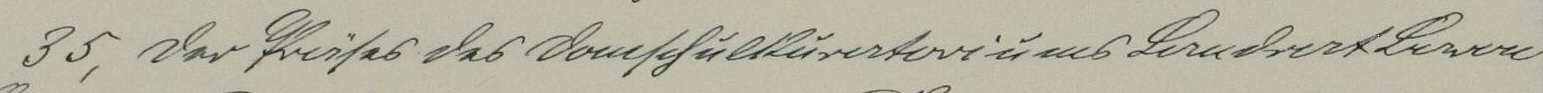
35. Der Präses des Domschulkuratoriums Landrat Baron
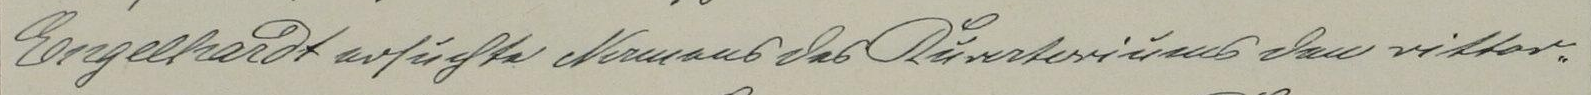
Engelhardt ersuchte Namens des Kuratoriums den ritter-
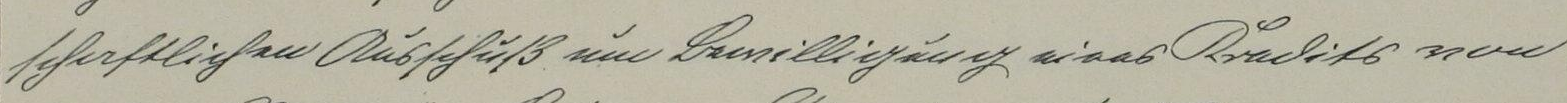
schaftlichen Ausschuß um Bewilligung eines Kredits von
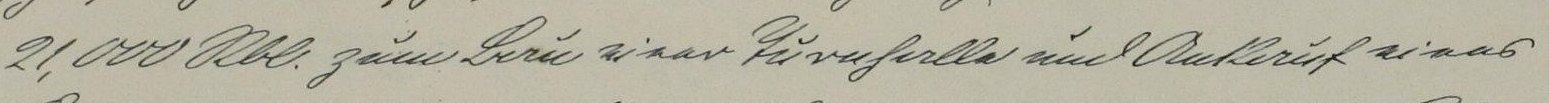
21.000 Rbl. zum Bau einer Turnhalle und Ankauf eines
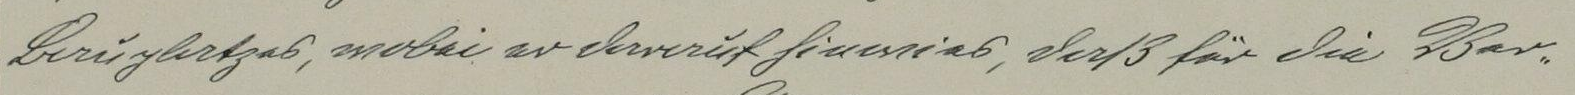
Bauplatzes, wobei er darauf hinwies, daß für die Ver-
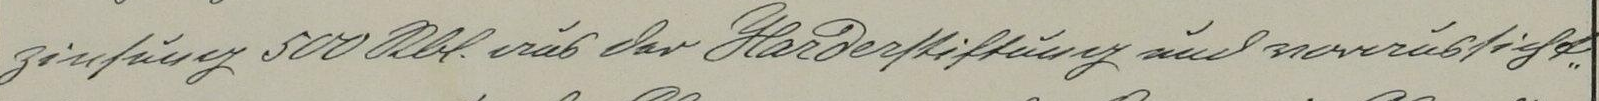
zinsung 500 Rbl. aus der Harderstiftung und voraussicht-
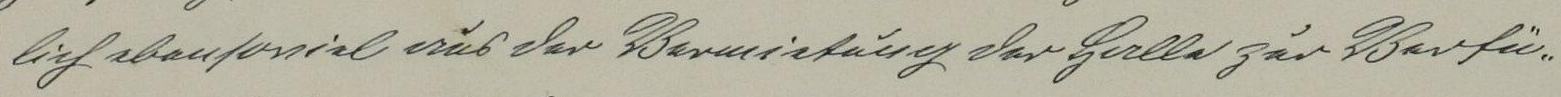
lich ebenso viel aus der Vermietung der Halle zur Verfü-
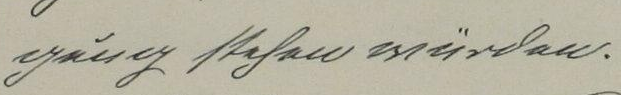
gung stehen würden.
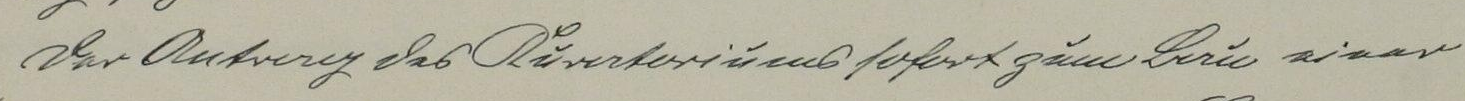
Der Antrag des Kuratoriums sofort zum Bau einer
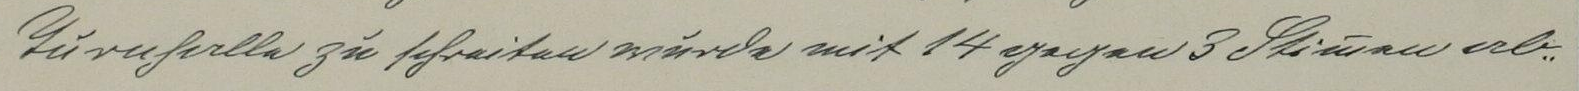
Turnhalle zu schreiten wurde mit 14 gegen 3 Stimmen ab-
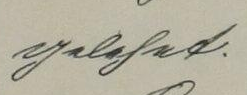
gelehnt.
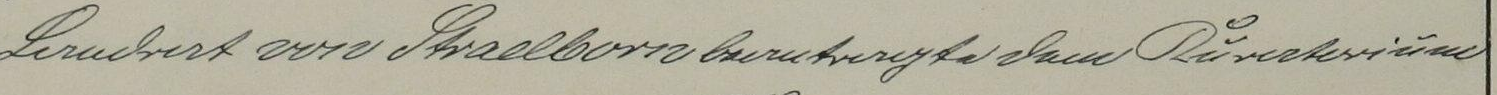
Landrat von Straelborn beantragte dem Kuratorium
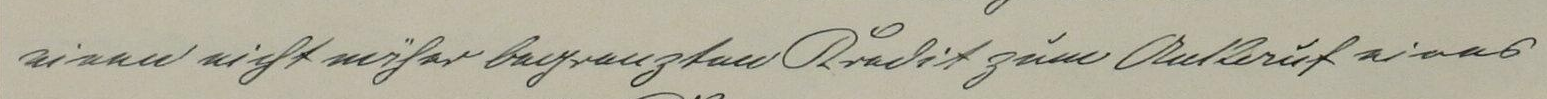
einen nicht näher begrenzten Kredit zum Ankauf eines
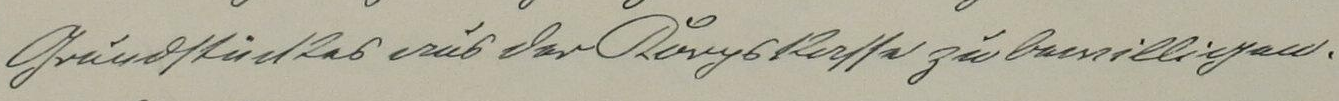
Grundstückes aus der Korpskasse zu bewilligen.
